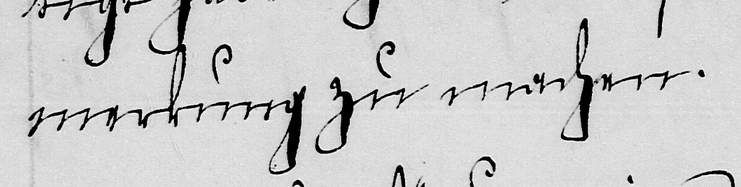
merkung zu machen.
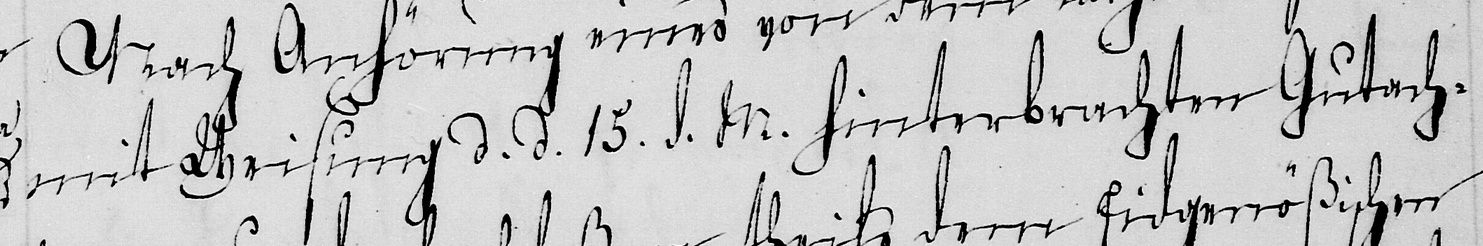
mit Weisung d. d. 15. d. M. hinterbrachten Gutach¬
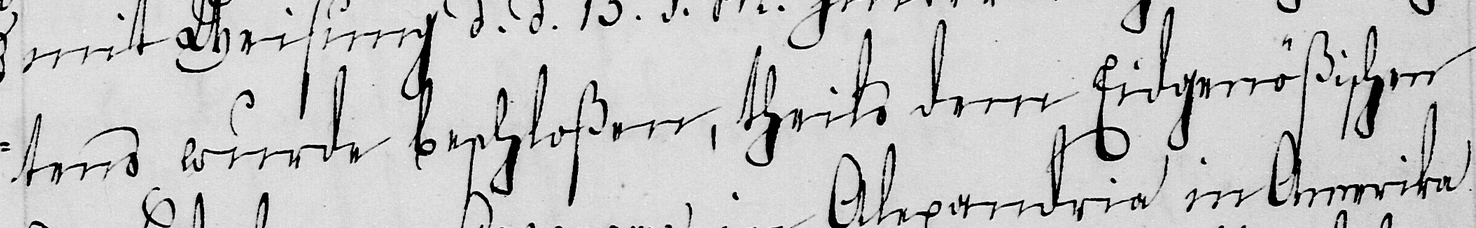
tens wurde beschloßen, theils dem Eidgenößischen
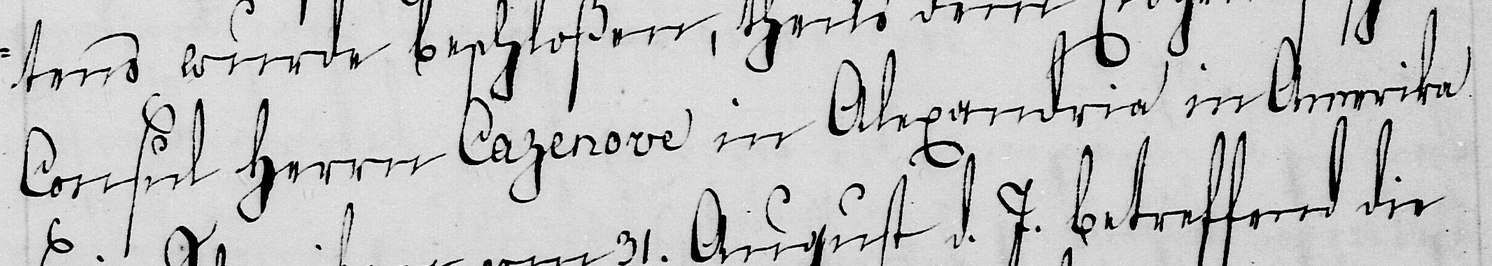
Consul Herrn Cazenove in Alexandria in Amerika
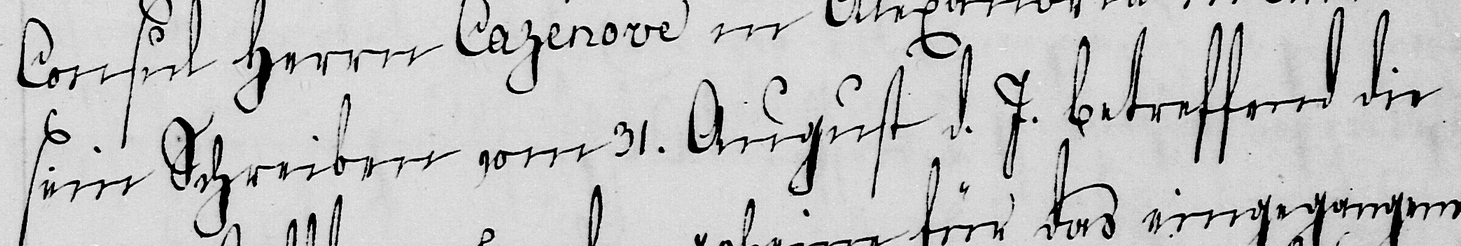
sein Schreiben vom 31. August d. J. betreffend die
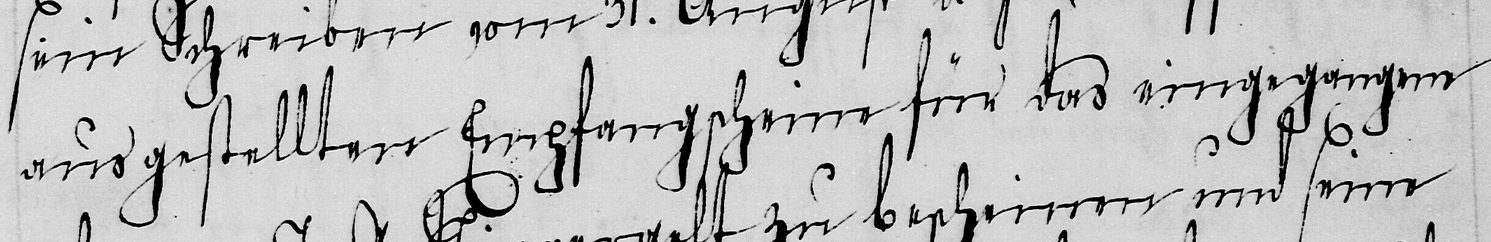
ausgestellten Empfangscheine für das eingegangene
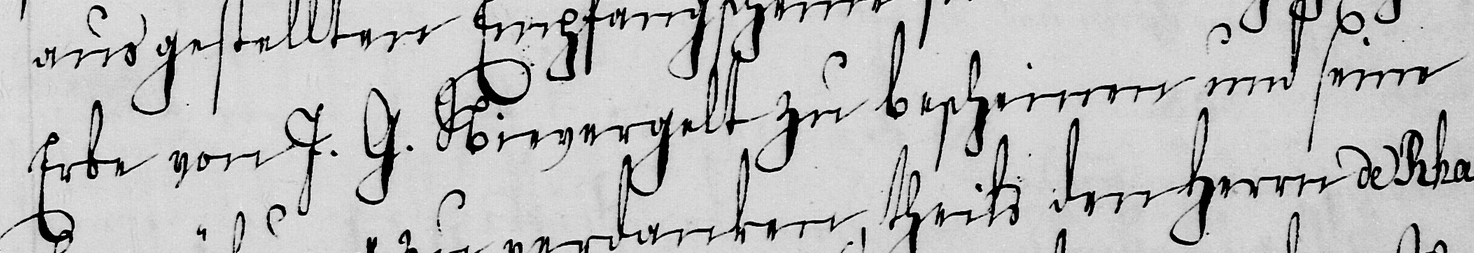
Erbe von J. G. Nievergelt zu bescheinen und seine
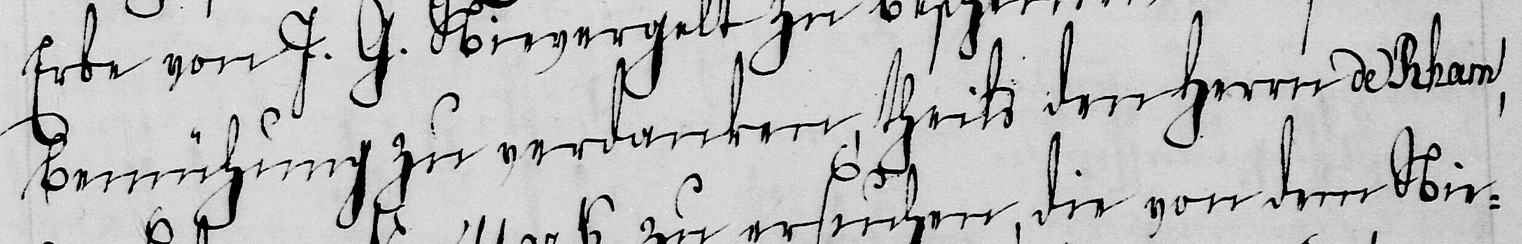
Bemühung zu vedanken, theils den Herrn de Rhan,
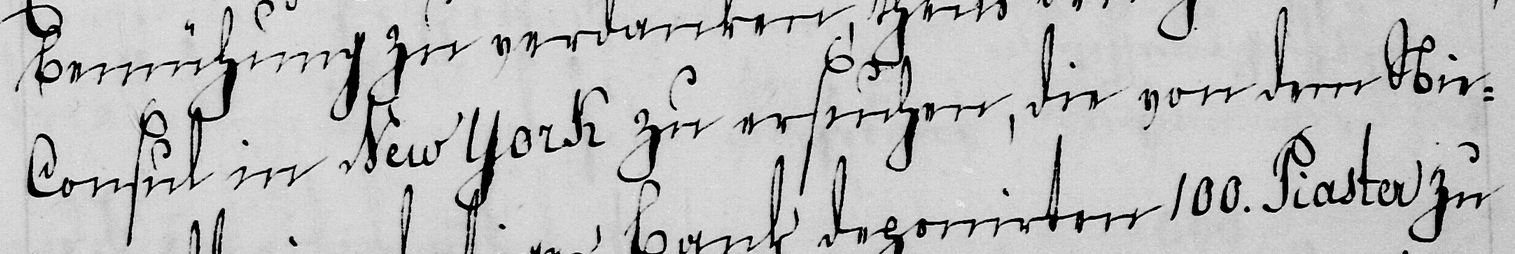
Consul in New York zu ersuchen, die von dem Nie¬
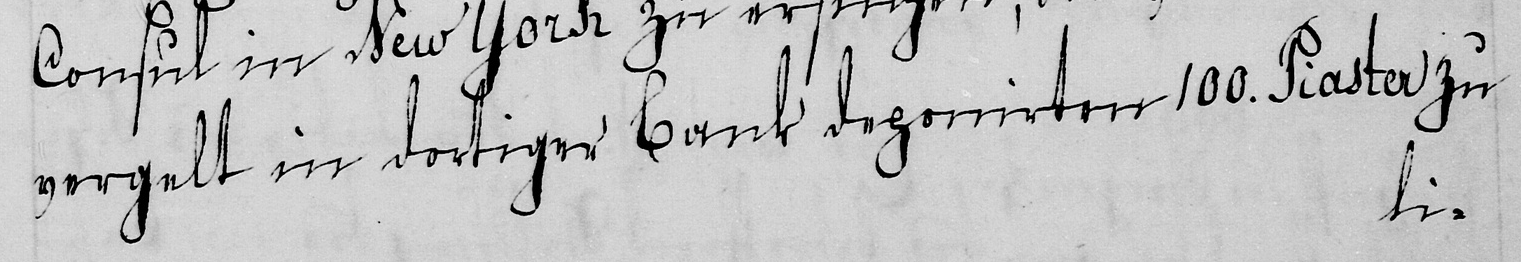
vergelt in dortiger Bank deponirten 100. Piasta zu
